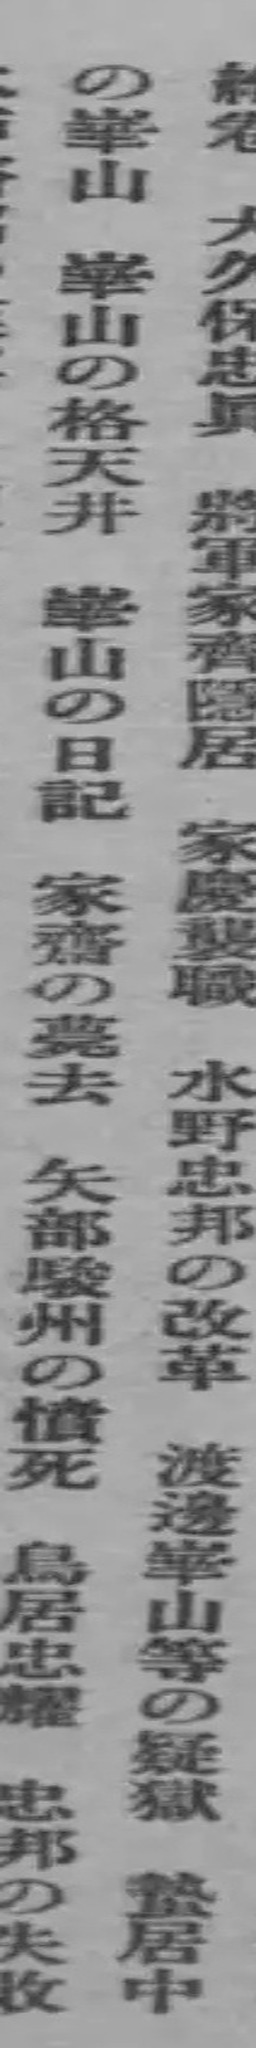の崋山崋山の格天井崋山の日記家斉の薨去矢部駿州の憤死鳥居忠耀忠邦の失敗
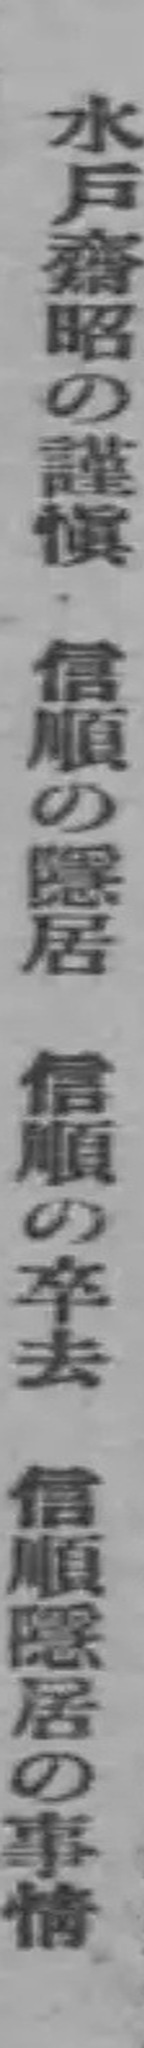水戸斉昭の謹慎信順の隠居信順の卒去信順隠居の事情
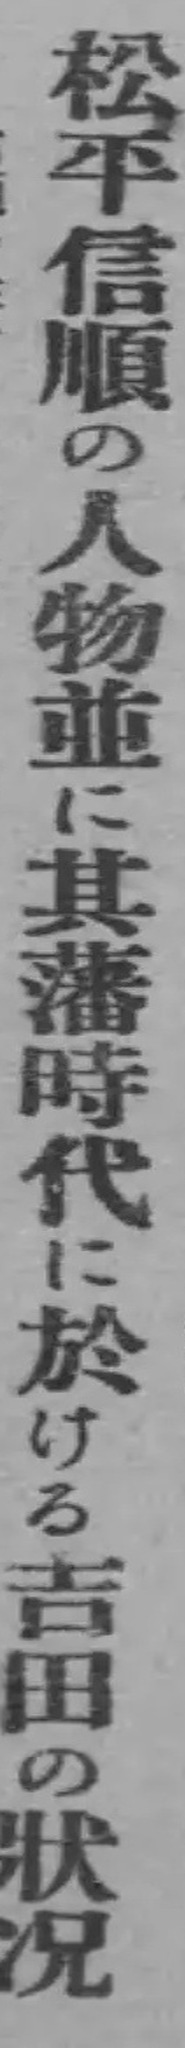松平信順の人物並に其藩時代に於ける吉田の状況
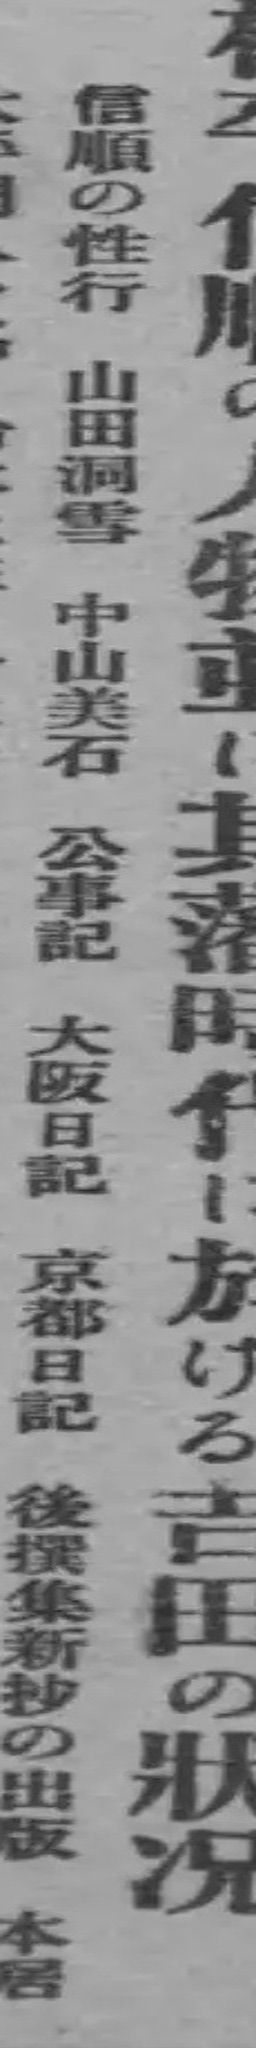信順の性行山田洞雪中山美石公事記大阪日記京都日記後撰集新抄の出版本居
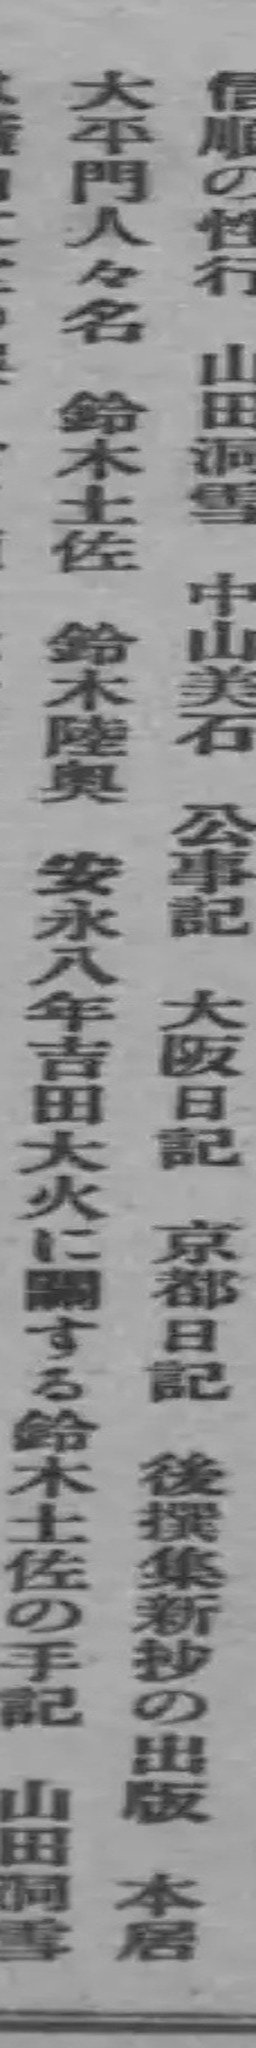大平門人々名鈴木土佐鈴木陸奥安永八年吉田大火に関する鈴木土佐の手記山田洞雪
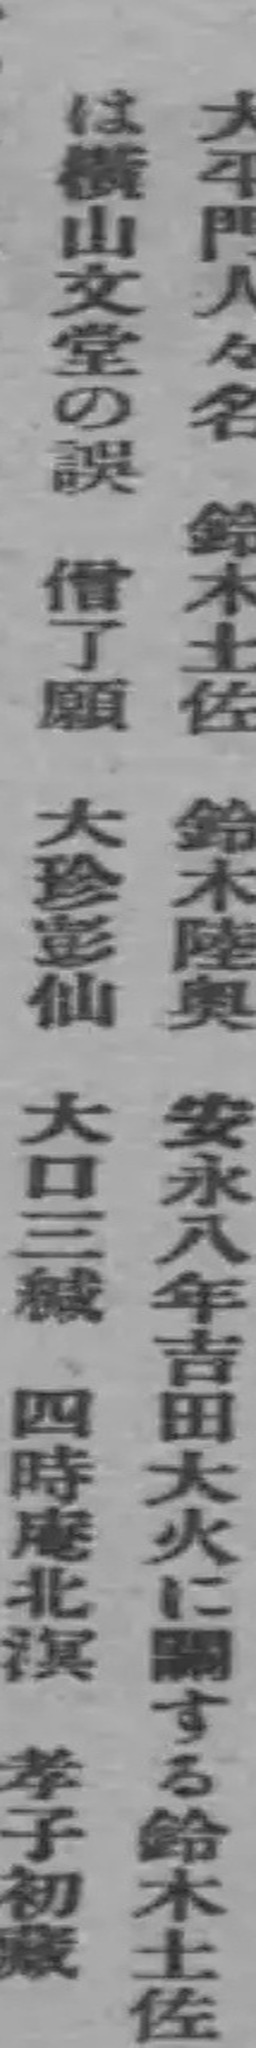は横山文堂の誤僧了願大珍彭仙大口三緘四時庵北溟孝子初蔵
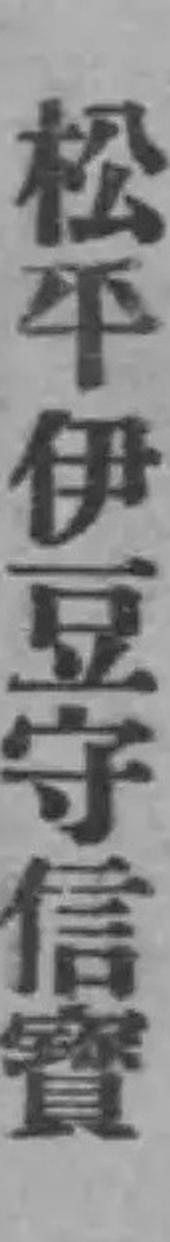松平伊豆守信宝
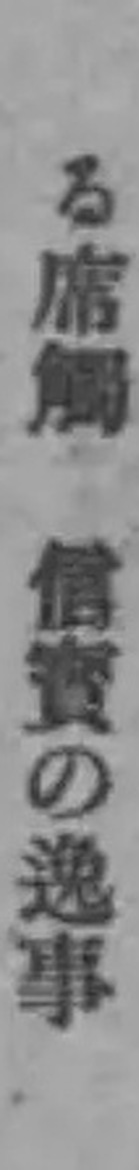る席触信宝の逸事
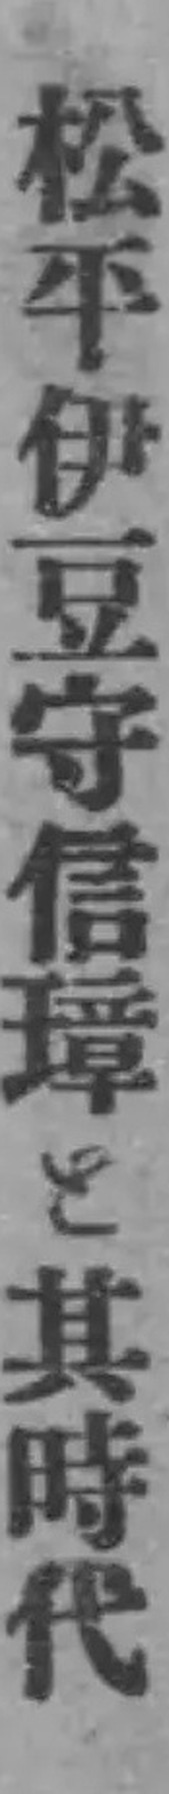松平伊豆守信璋と其時代
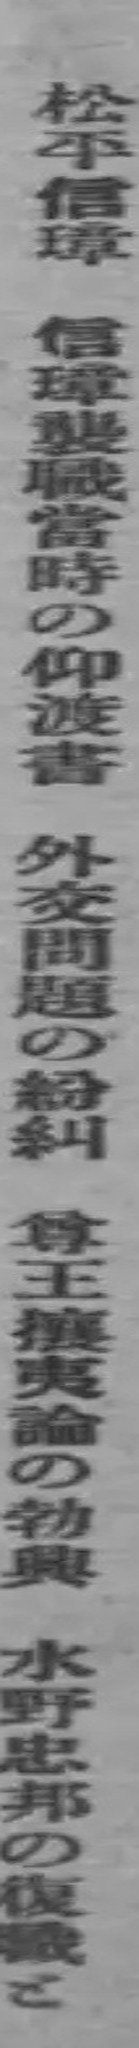松平信璋信璋襲職当時の仰渡書外交問題の紛糾尊王攘夷論の勃興水野忠邦の復職と
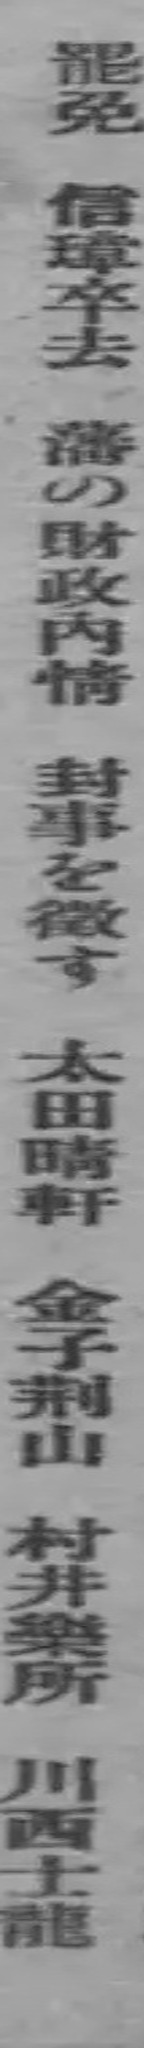罷免信璋卒去藩の財政内情封事を徴す太田晴軒金子荊山村井楽所川西士龍
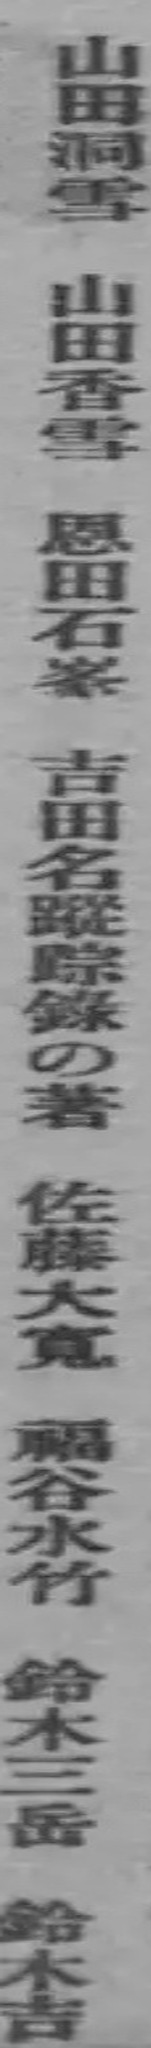山田洞雪山田香雪恩田石峯吉田名蹝踪録の著佐藤大寛福谷水竹鈴木三岳鈴木吉
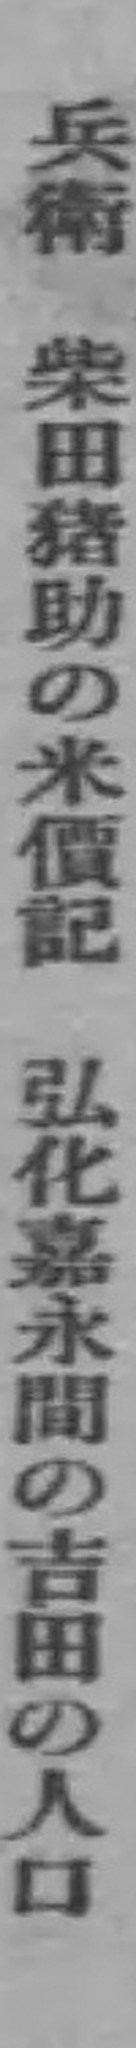兵衛柴田猪助の米価記弘化嘉永間の吉田の人口
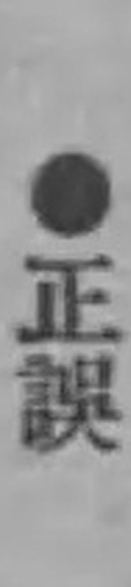●正誤
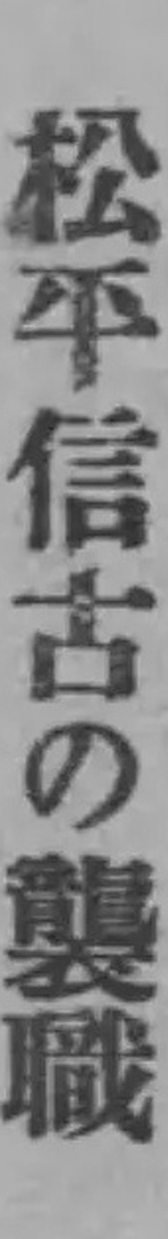松平信古の襲職
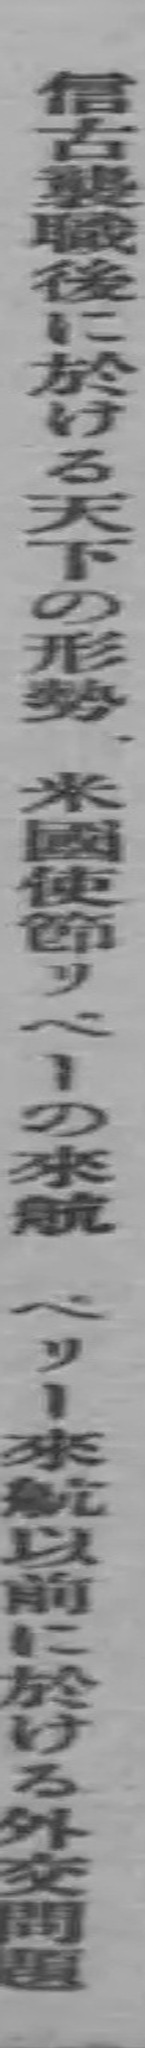信古襲職後に於ける天下の形勢米国使節リペーの来航ペリー来航以前に於ける外交問題
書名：豊橋市史談
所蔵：国立国会図書館 National Diet Library, JAPAN
